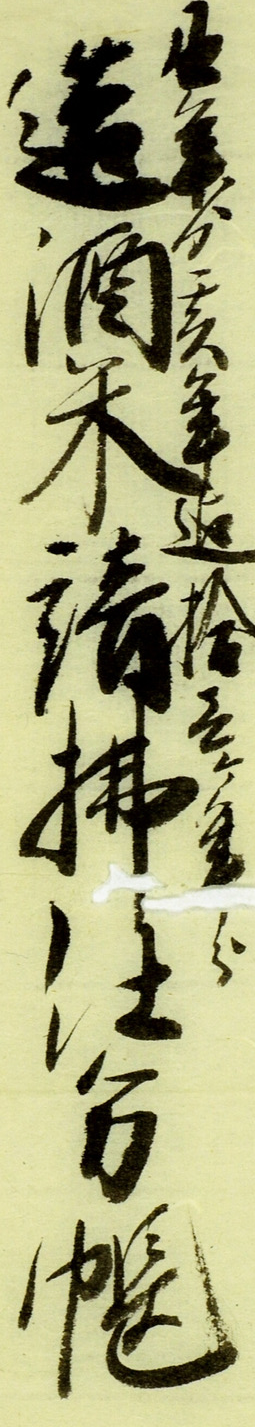造酒米請払仕分帳
